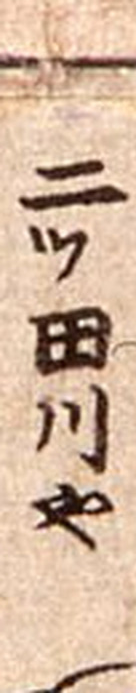二つ田川や
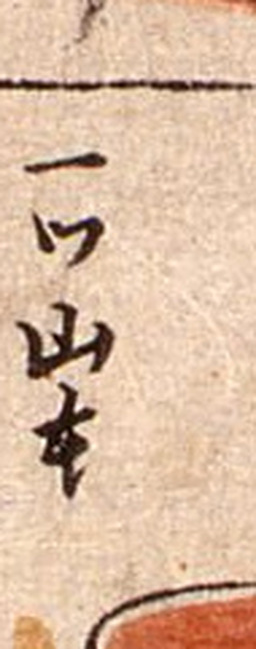一つ山本
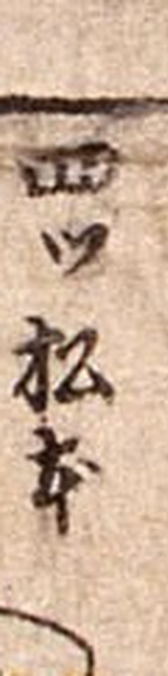四つ松本
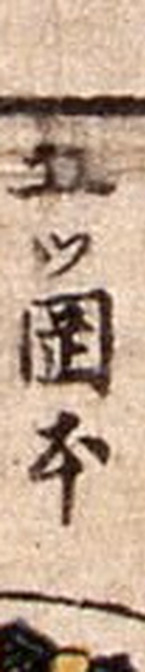五つ岡本
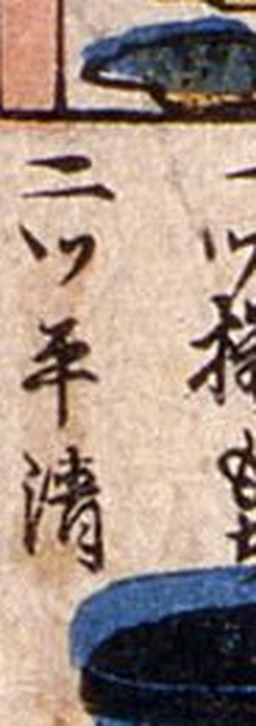二つ平清
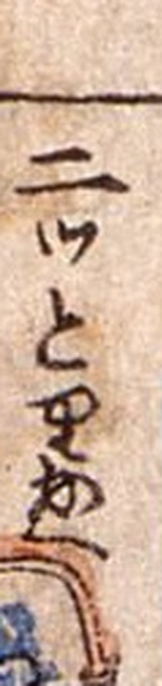二つとりかへ
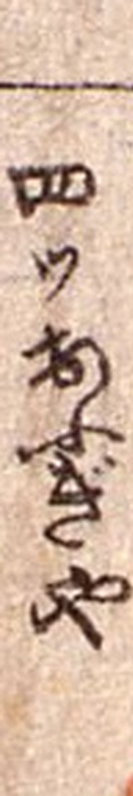四つあふぎや
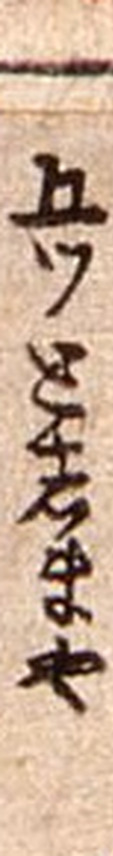五つとしまや
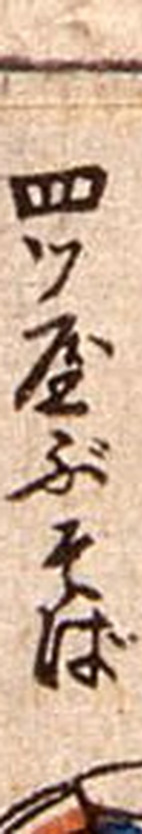四つやぶそば
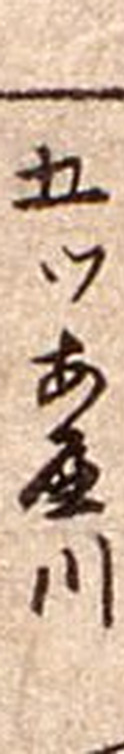五つあべ川
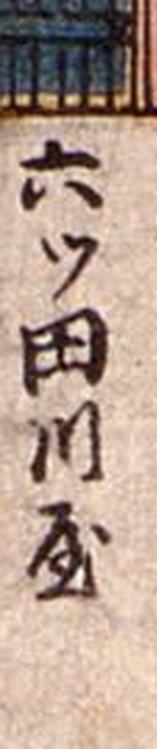六つ田川屋
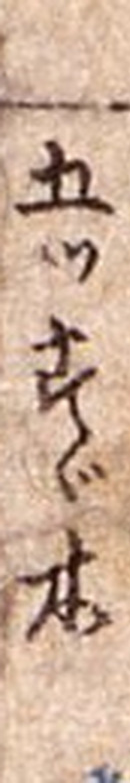五つすゞ木
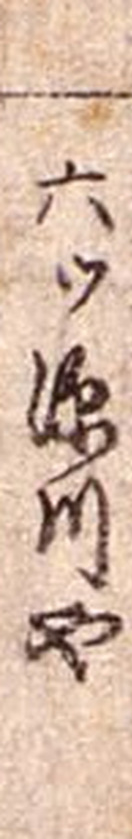五つ深川や
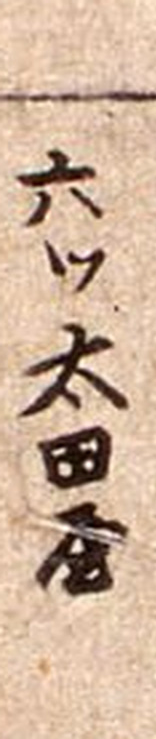六つ太田屋
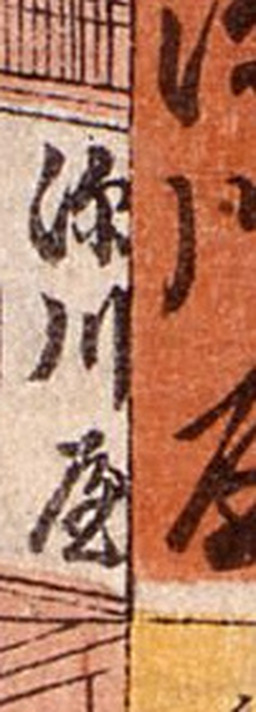深川屋
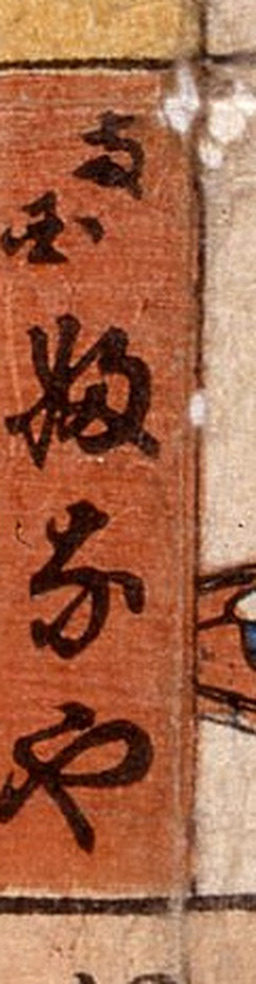ふな儀
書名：新版御府内流行名物案内雙六
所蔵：東京学芸大学附属図書館
